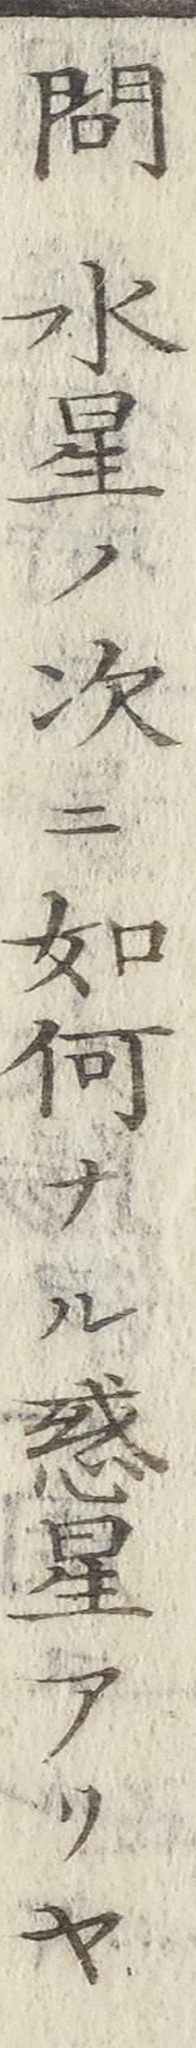問水星ノ次ニ如何ナル惑星アリヤ
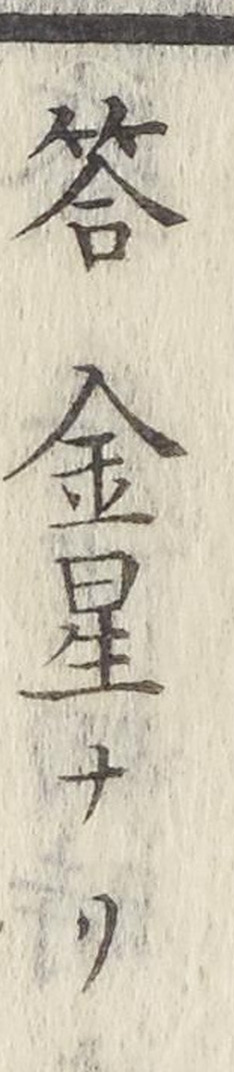答金星ナリ
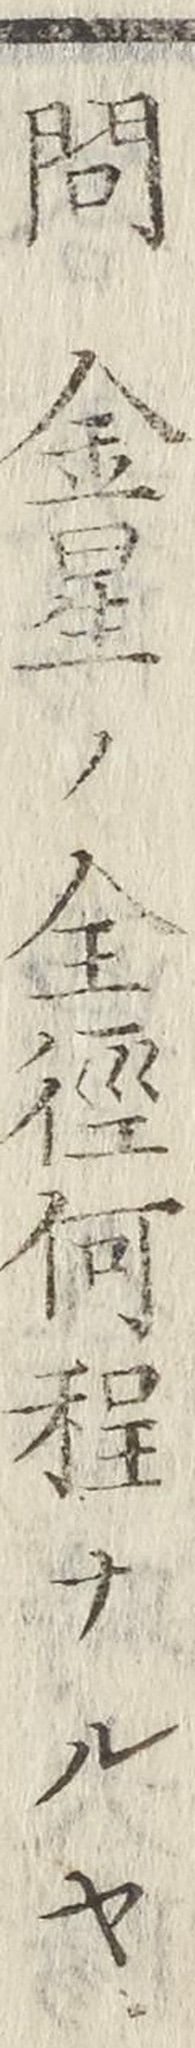問金星ノ全径何程ナルヤ
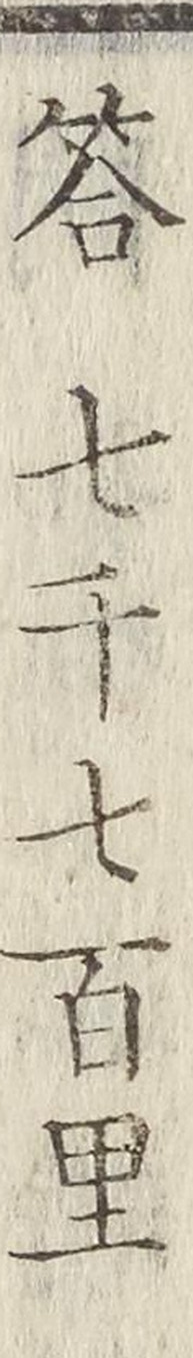答七千七百里
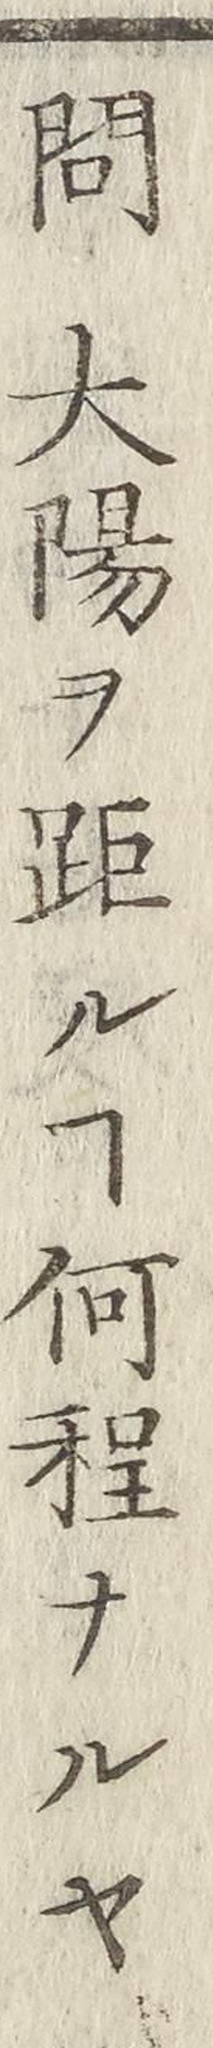問大陽ヲ距ルコト何程ナルヤ
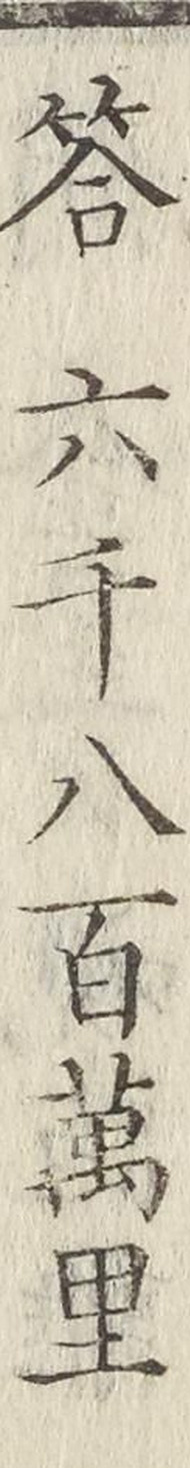答六千八百万里
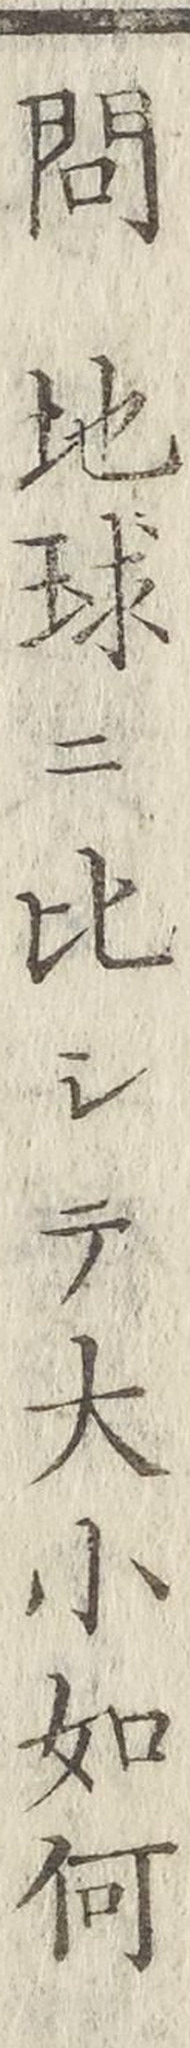問地球ニ比シテ大小如何
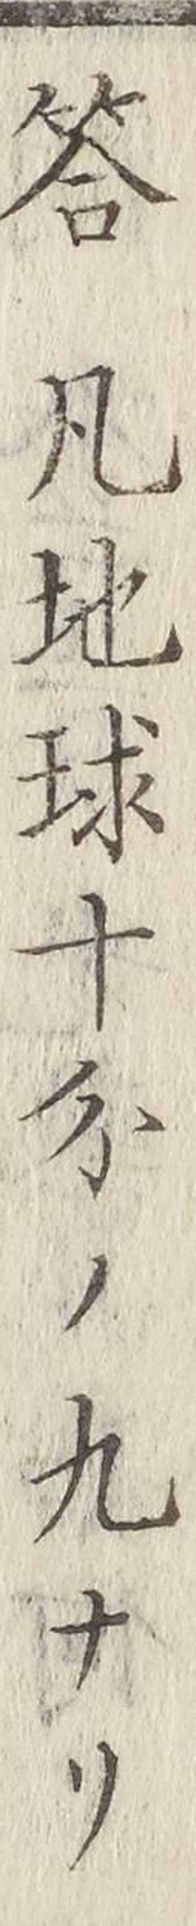答凡地球十分ノ九ナリ
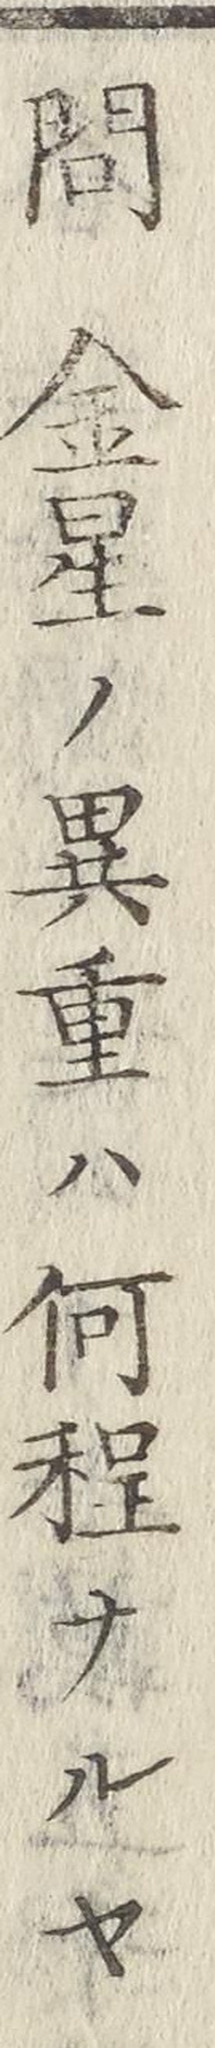問金星ノ異重ハ何程ナルヤ
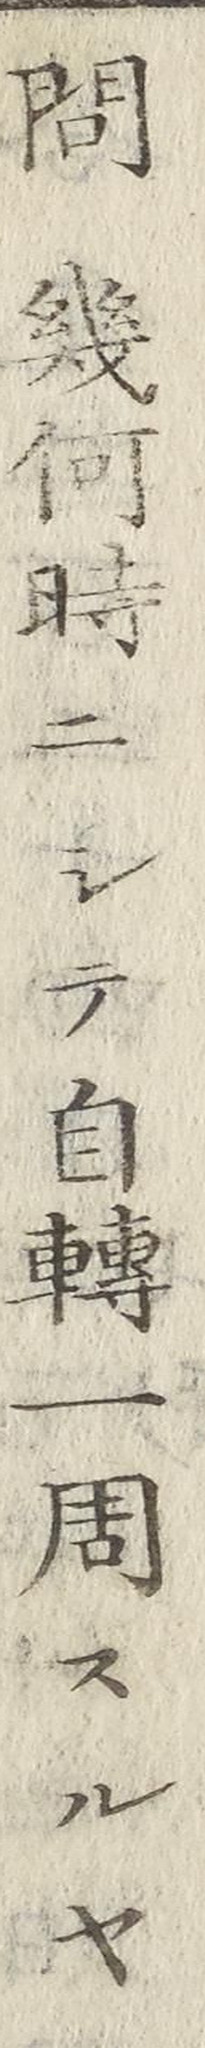問幾何時ニシテ自転一周スルヤ
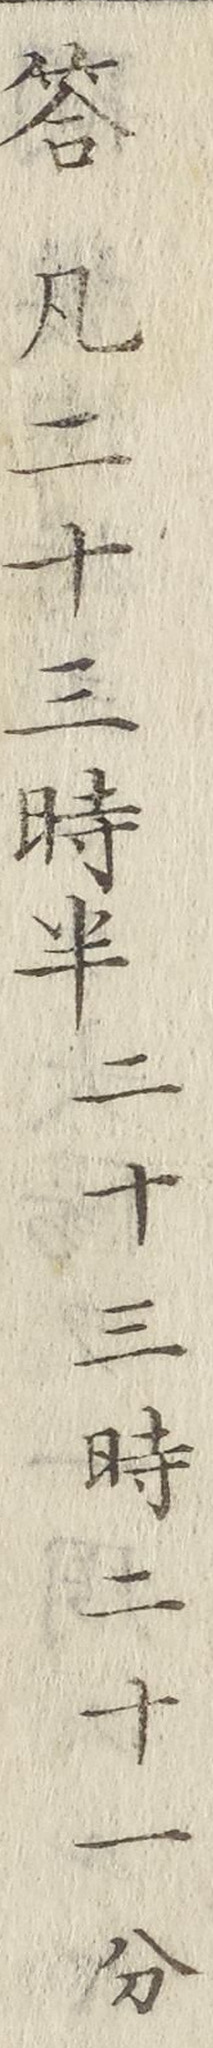答凡二十三時半二十三時二十一分

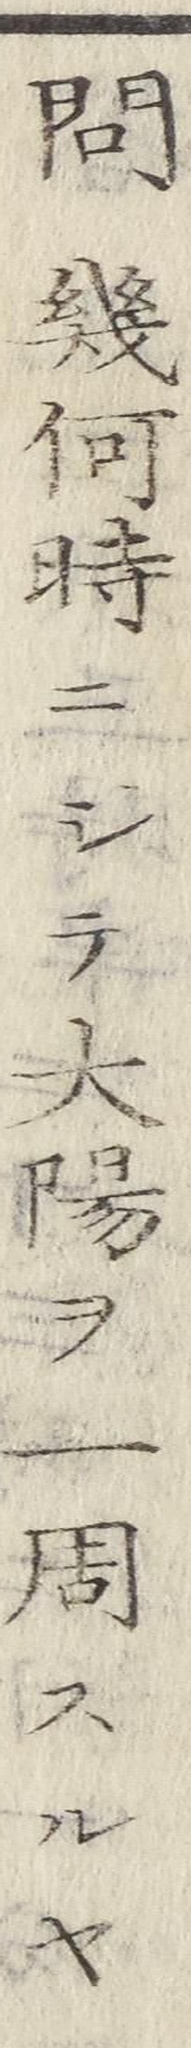問幾何時ニシテ大陽ヲ一周スルヤ
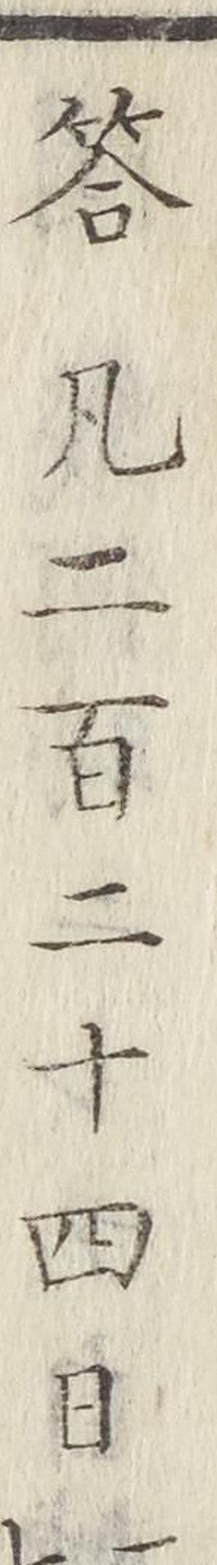答凡二百九十日
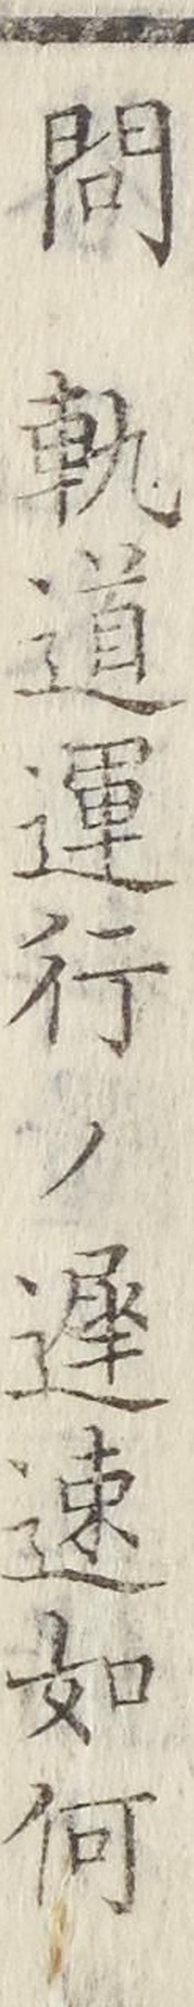問軌道運行ノ遅速如何
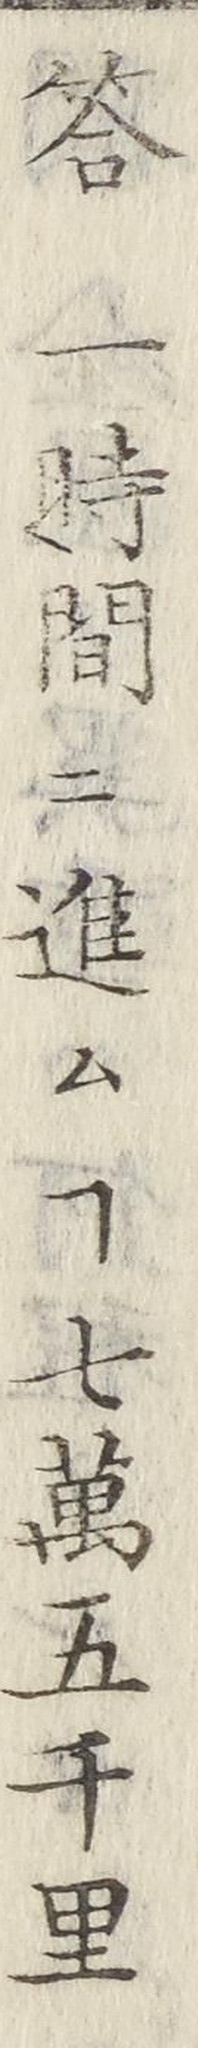答一時間ニ進ムコト七萬五千里
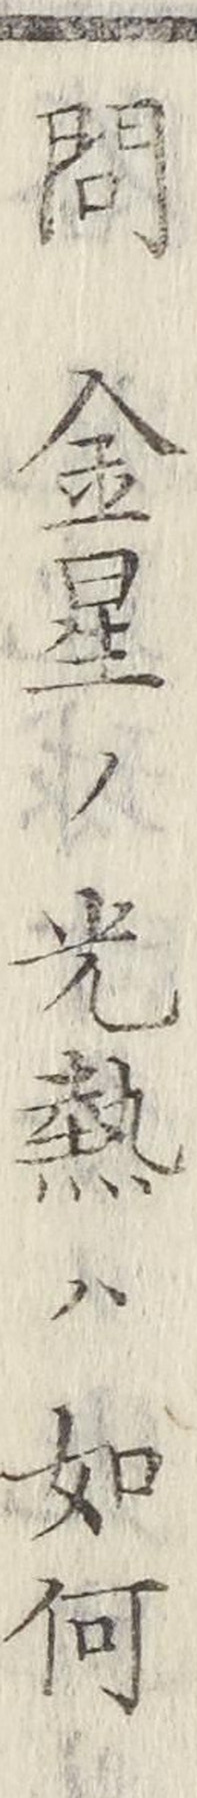問金星ノ光熱ハ如何
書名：星学圖説　上
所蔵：東京大学地震研究所図書室 Earthquake Research Institute Library, The University of Tokyo, JAPAN
